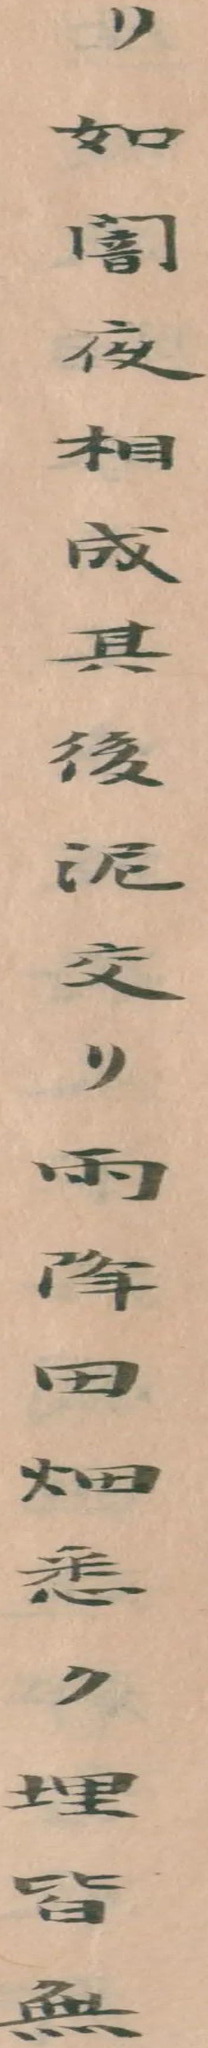リ如闇夜相成其後泥交り雨降田畑悉ク埋皆無
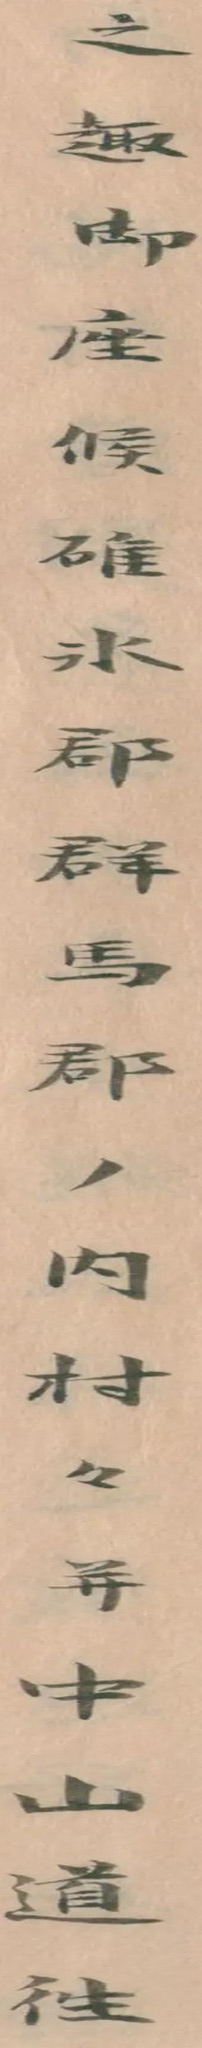之趣御座候碓井郡群馬郡ノ内村々并中山道往
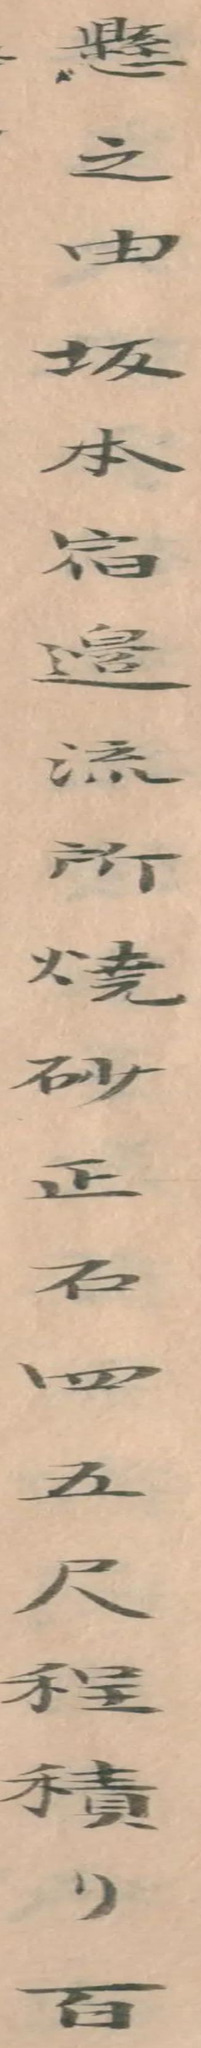懸之由坂本宿辺流所焼砂正石四五尺程積り百

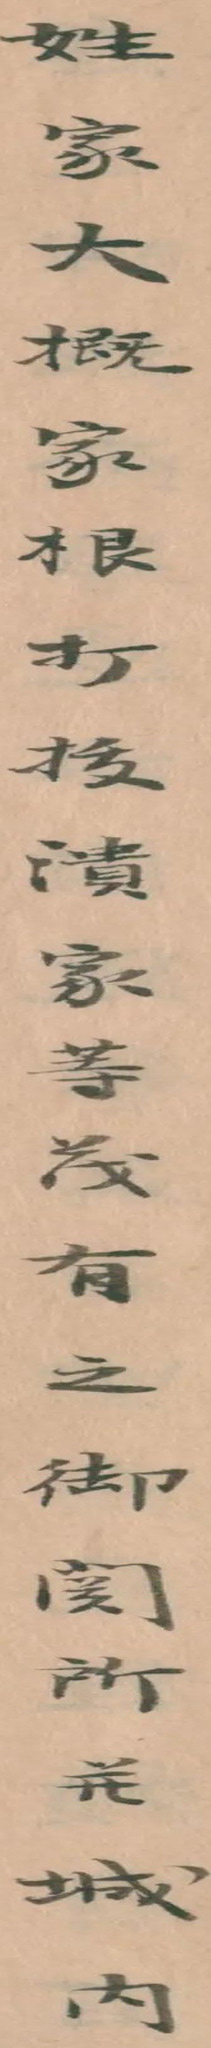姓家大概家根打抜潰家等も有之御関所并城内
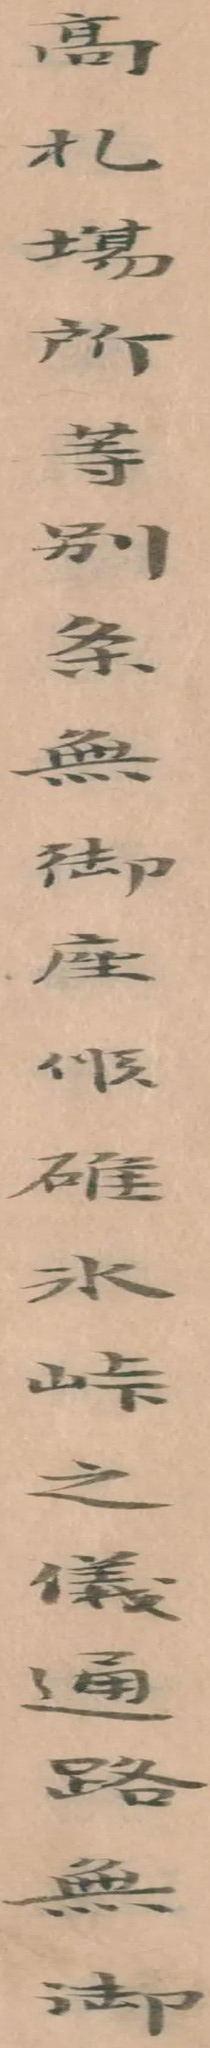高札場所等別条無御座候碓氷峠之儀通路無御
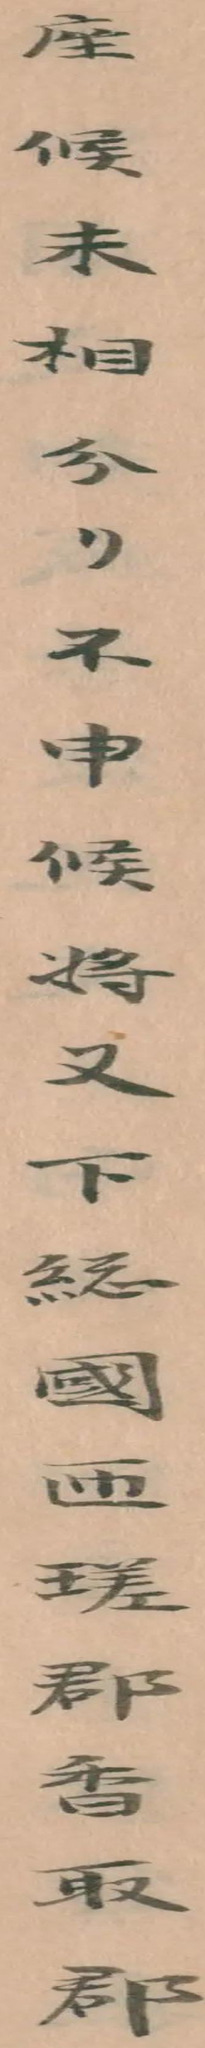座候未相分り不申候将又下総国匝瑳郡香取郡
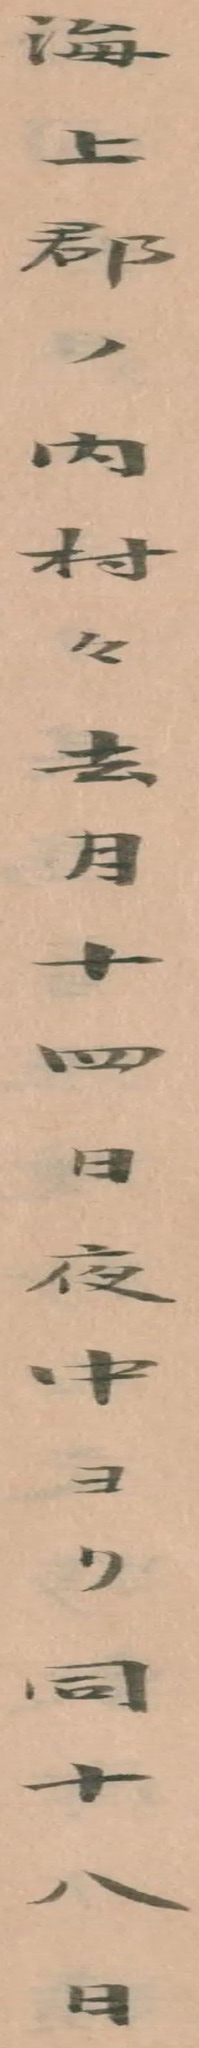海上群ノ内村々去月十四日夜中ヨリ同十八日
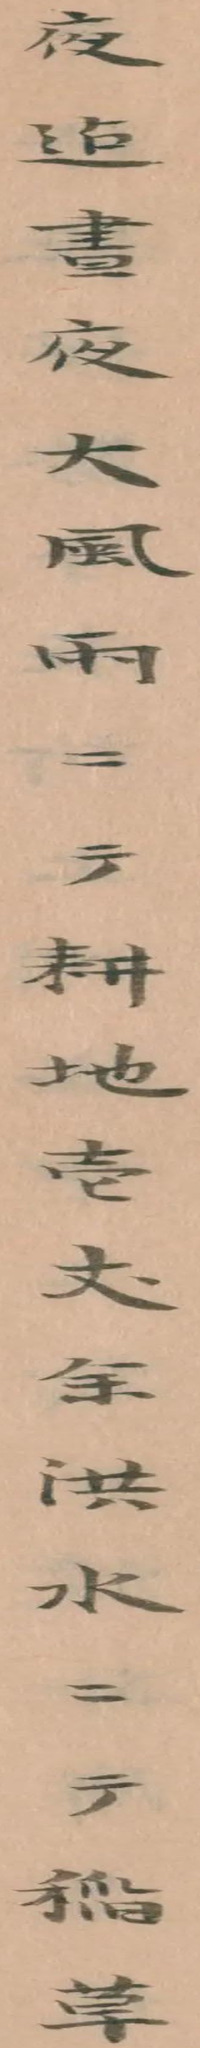夜迄晝夜大風雨ニテ耕地壱丈余洪水ニテ稲草
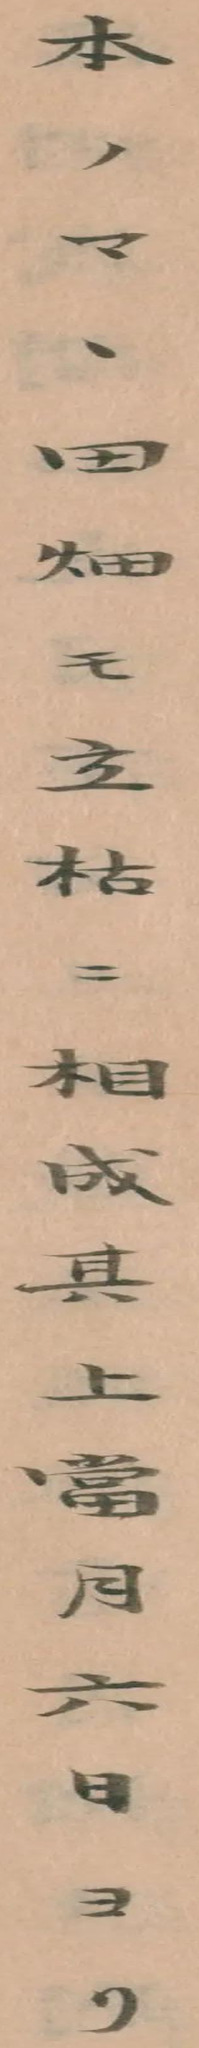本ノマゝ田畑モ立枯二相成其上当月六日ヨリ
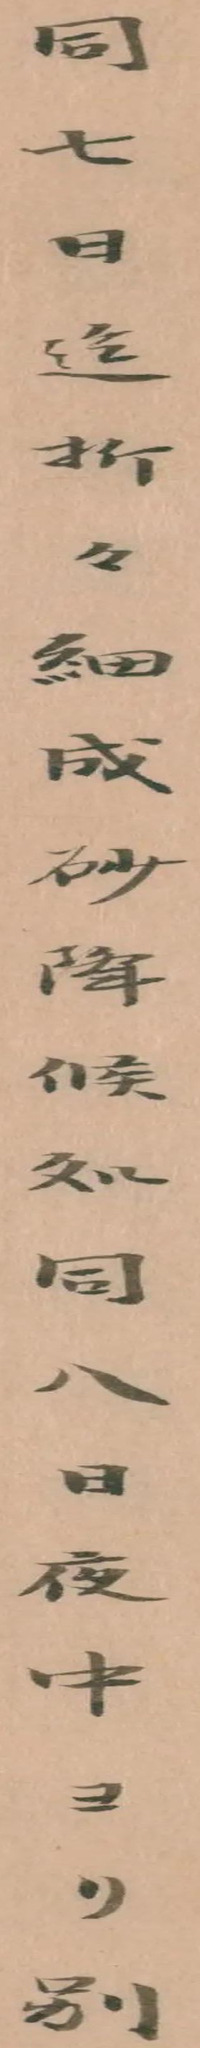同七日迄折々細成砂降候処同八日夜中ヨリ別
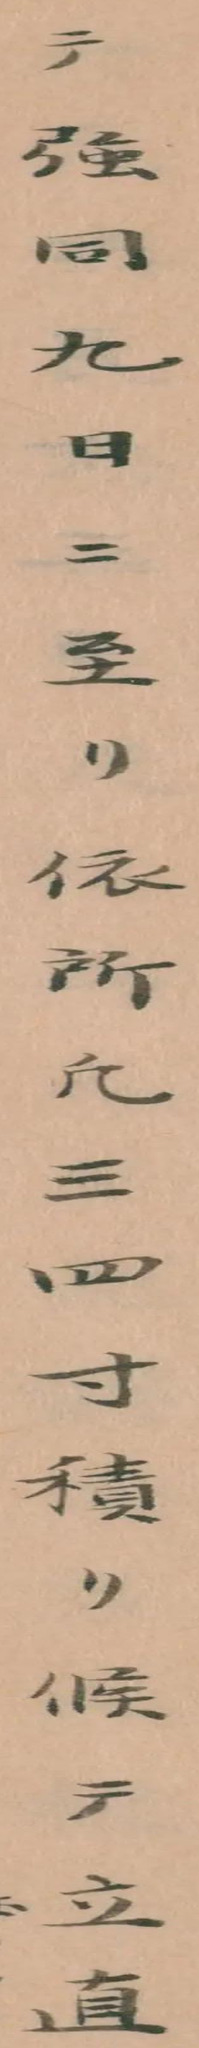テ強同九日二至り依所凡三四寸積り候テ立直
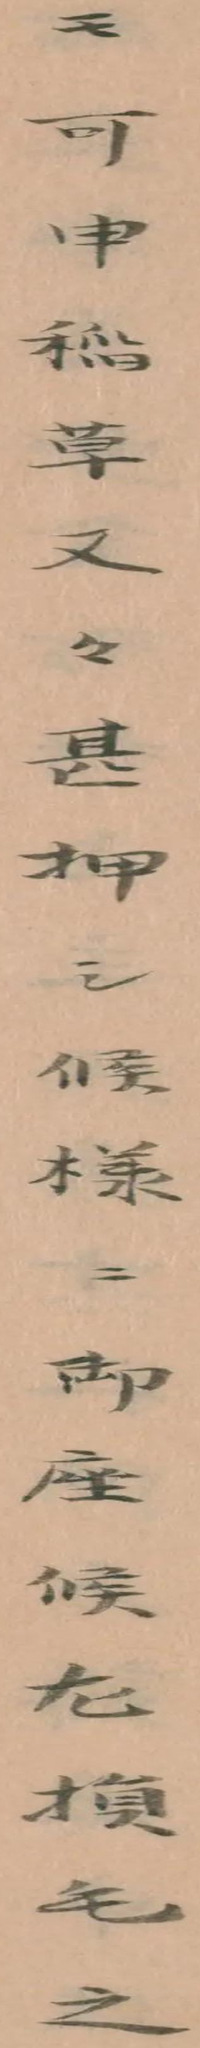モ可申稲草又々甚押シ候様二御座候左損毛之
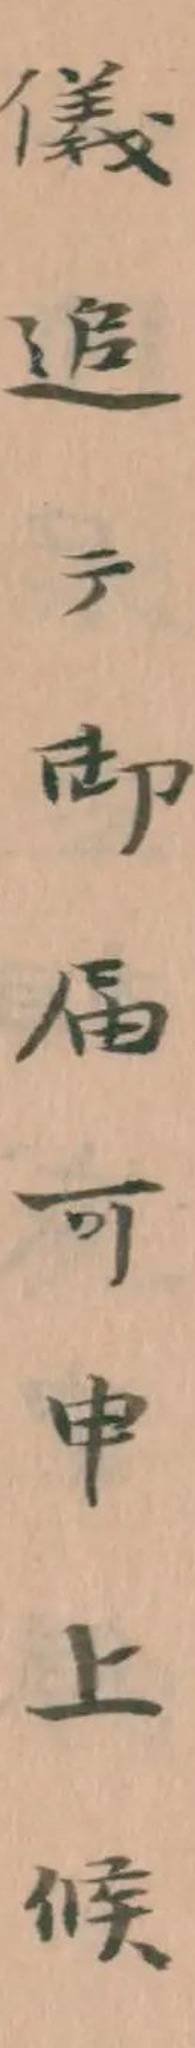儀追テ御届可申上候
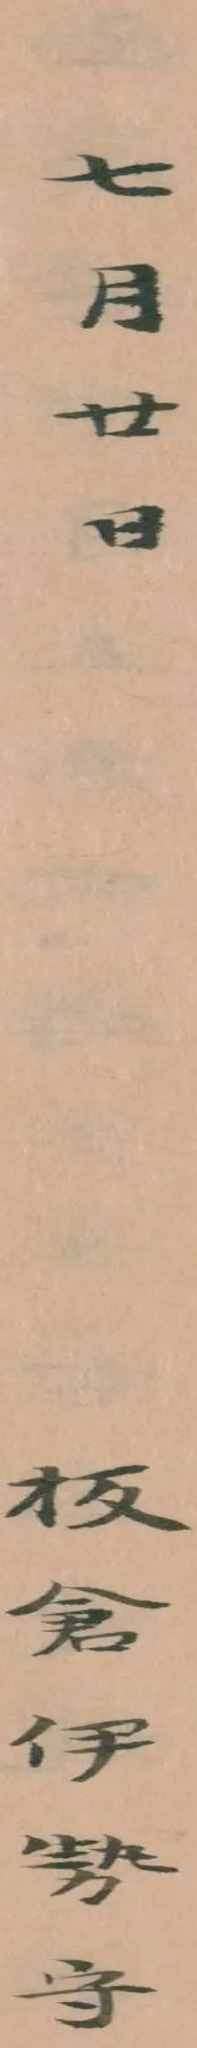七月廿日板倉伊勢守
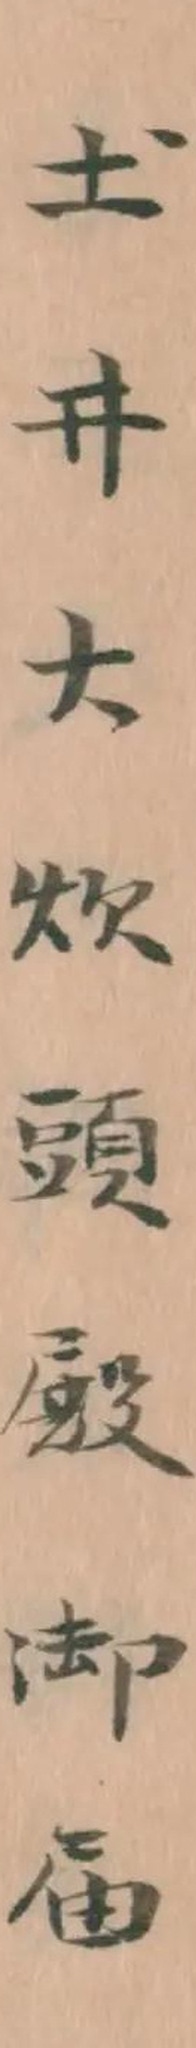土井大炊頭殿御届
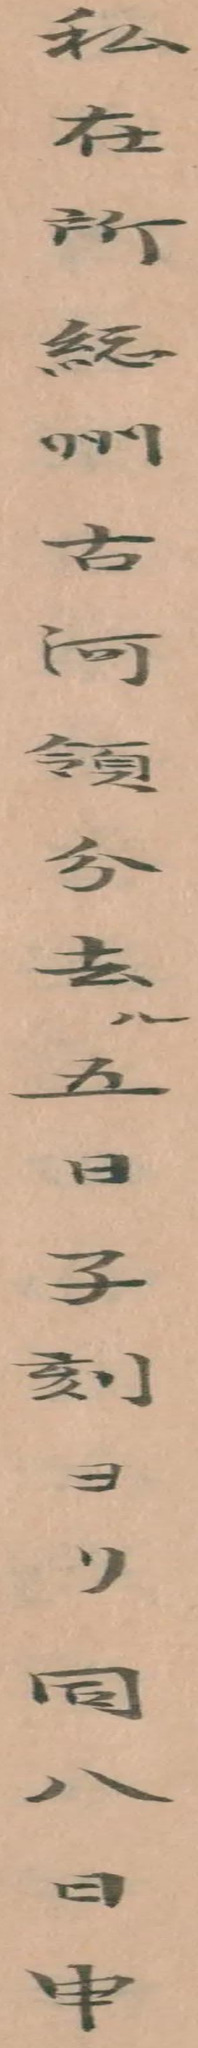私在所総州古川領分去ㇽ五日子刻ヨリ同八日申
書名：地災撮要. 巻1(噴火山・地震ノ部)
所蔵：国立国会図書館 National Diet Library, JAPAN
